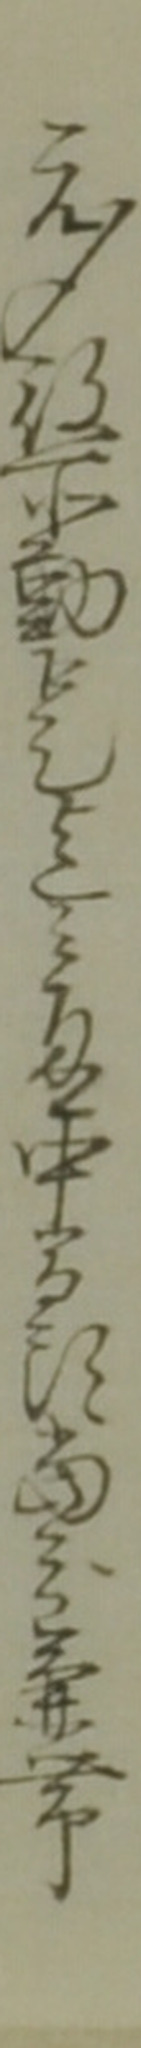元〆役所勤是迄之通仲間頭当分兼帯
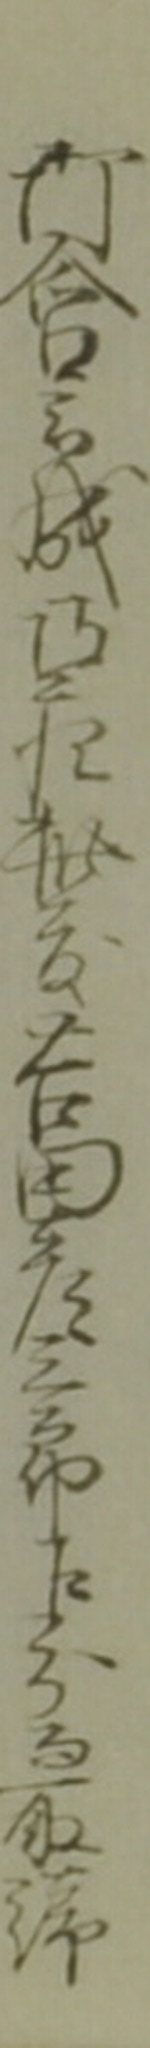御含被成御座此度吉田彦三郎江分而取締
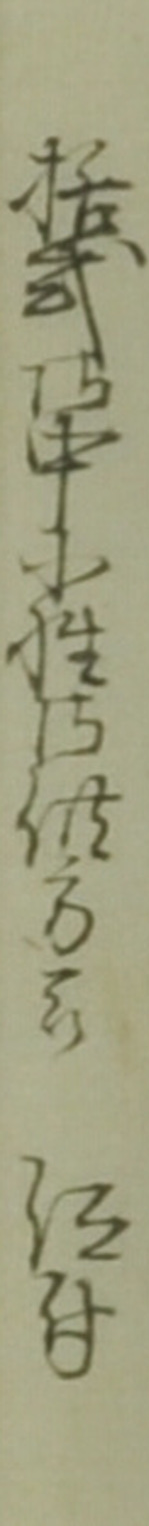格式御中小性御供方被仰付

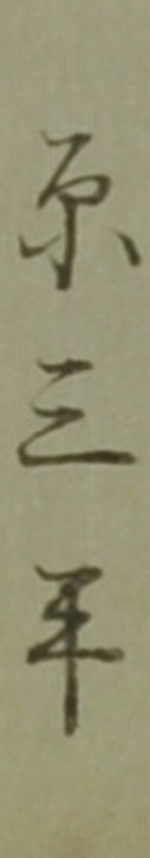原三平
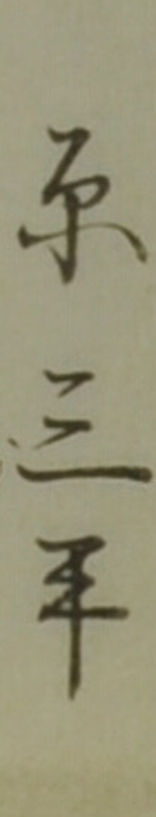原三平
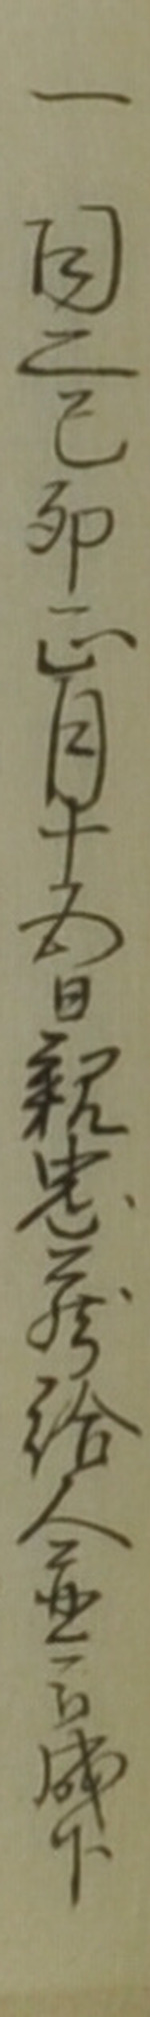一同二己卯正月十五日親忠蔵給人並被成下
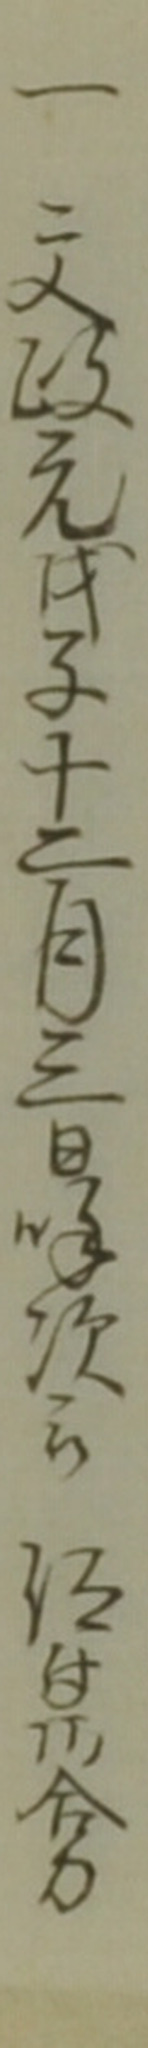一文政元戌子十二月三日呼次被仰付御合力
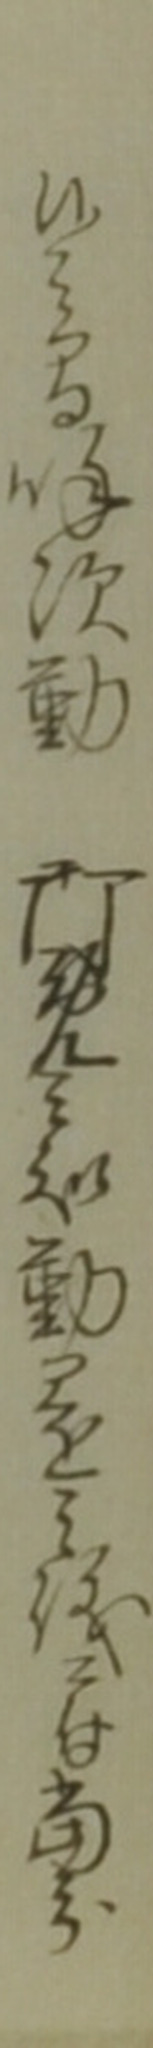候之間呼次勤御免之処勤懸之儀ニ付当分
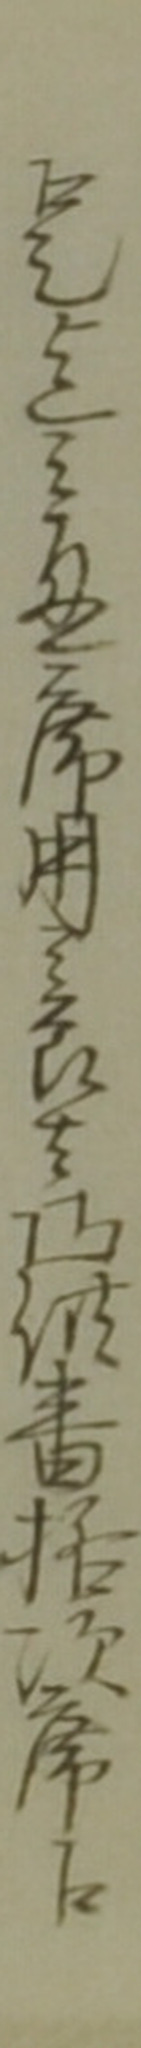是迄之通席用之節者御供番格次席江
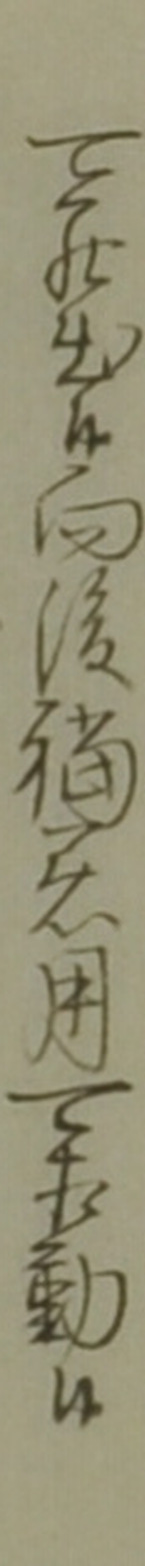可罷出候向後襠着用可相勤候
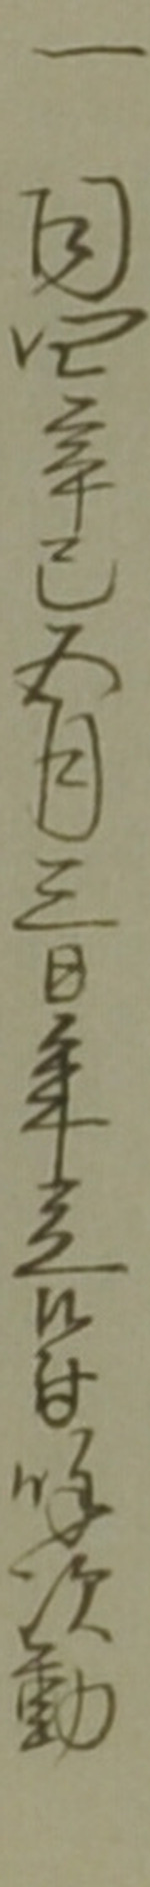一同四辛巳五月三日年立候付呼次勤
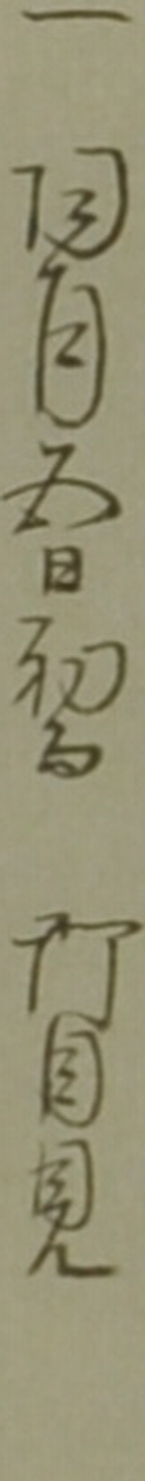一同月五日初而御目見
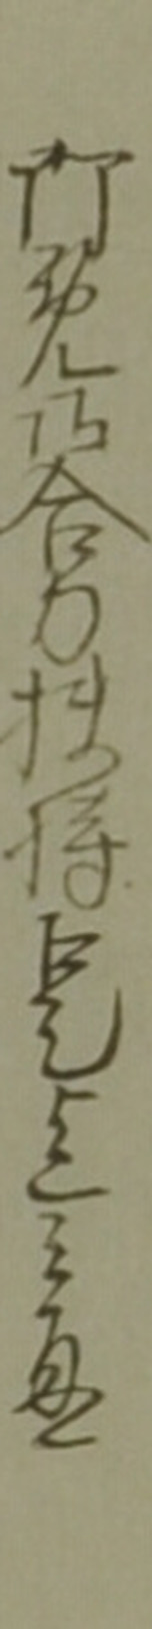御免御合力扶持是迄之通

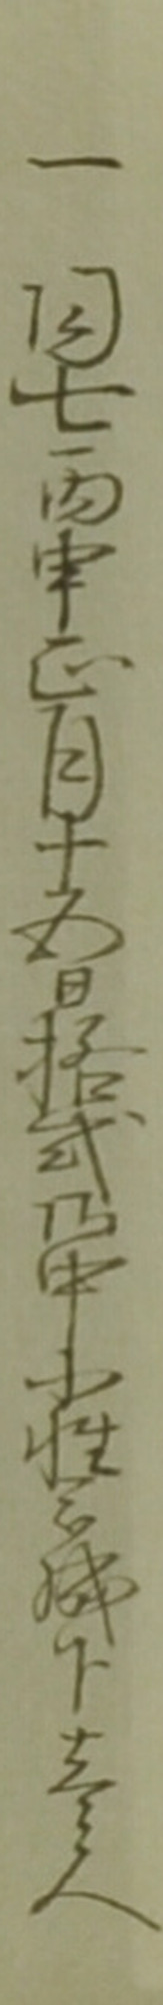一同七丙申正月十五日格式御中小性被成下壱人
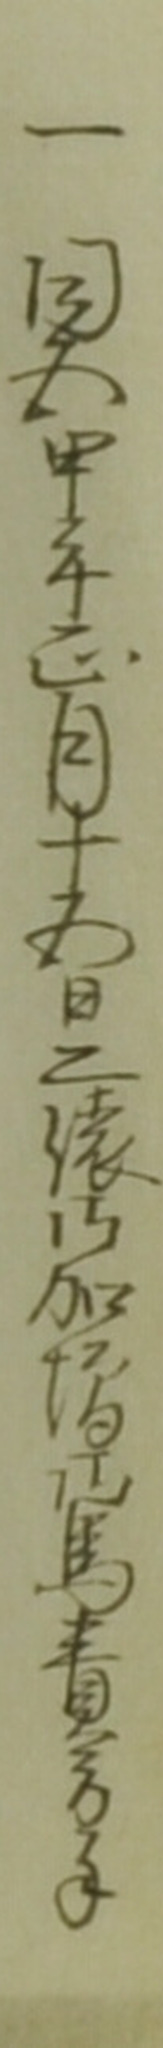一同五甲午正月十五日二俵御加増御馬責方手
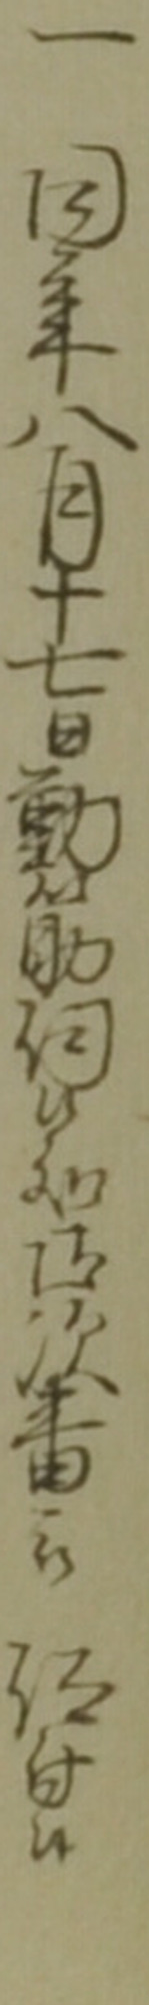一同年八月十七日勤筋伺候処御次番被仰付候
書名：無足諸士勤仕録（一）
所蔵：伊那市立高遠町図書館・合同会社AMANE
